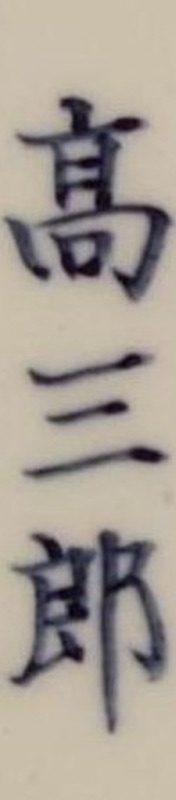高三郎
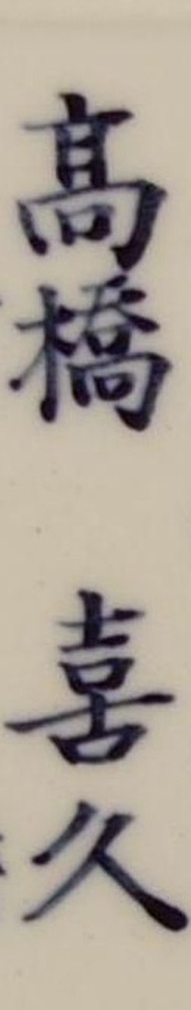高橋喜久
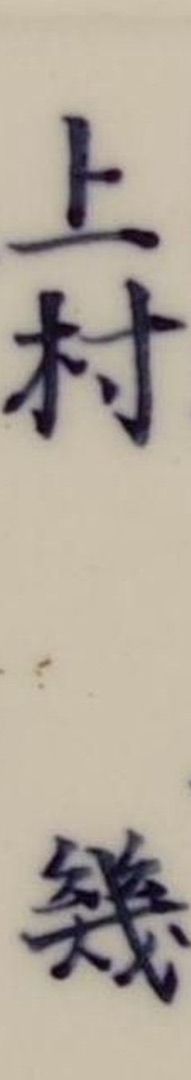上村幾
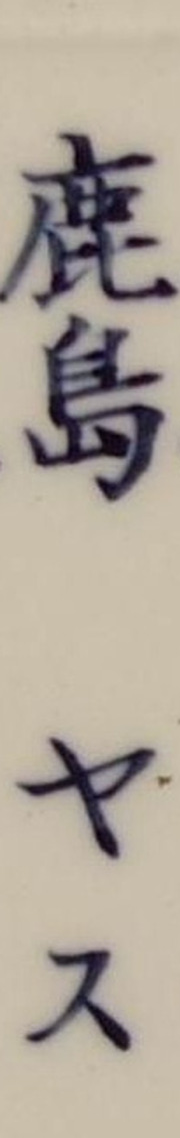鹿島ヤス
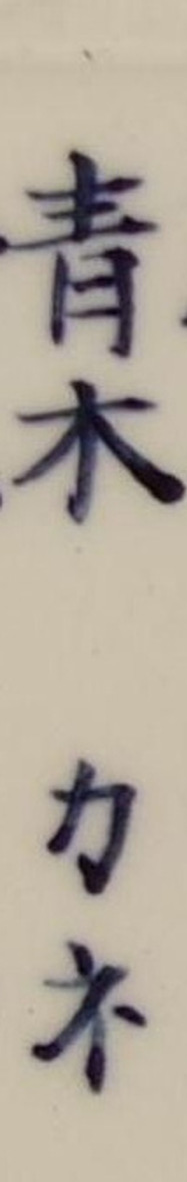青木カネ
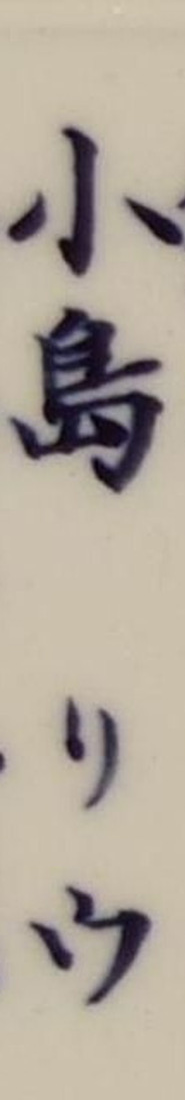小島リウ
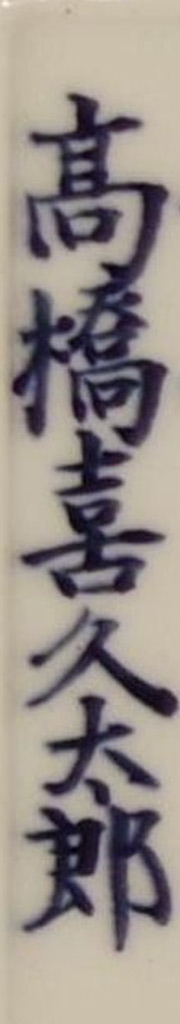高橋喜久太郎

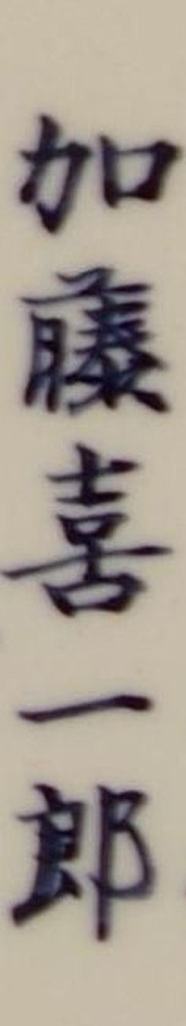加藤喜一郎
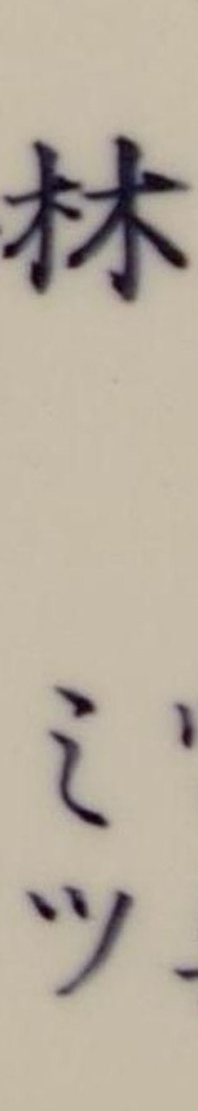林ミツ
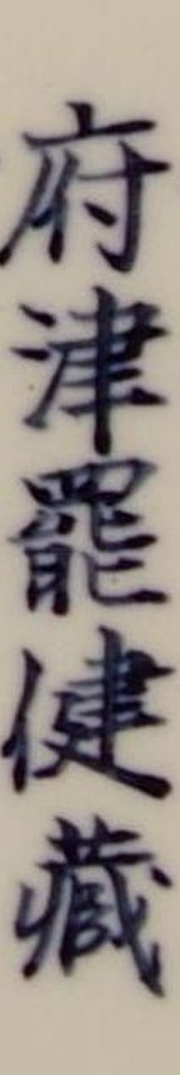府津罷健蔵
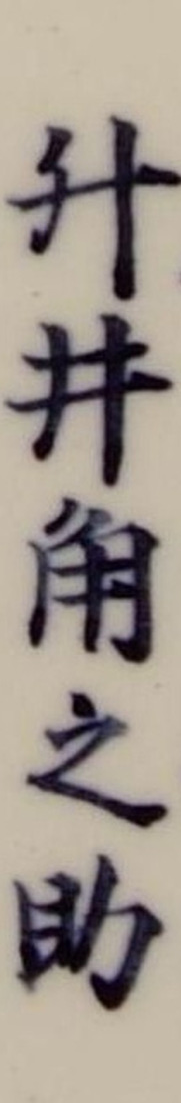竹井角之助
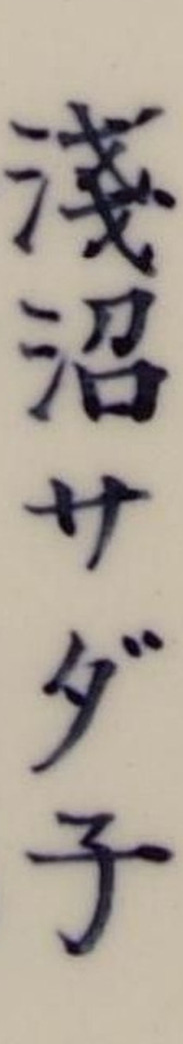浅沼サダ子
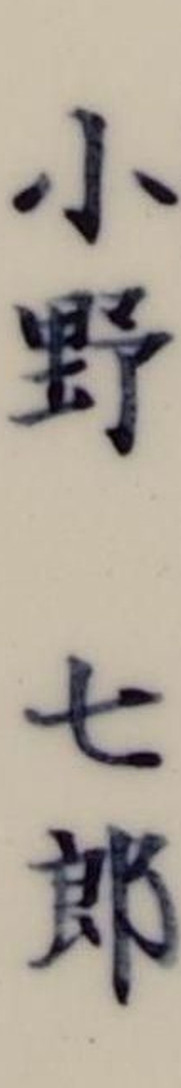小野七郎
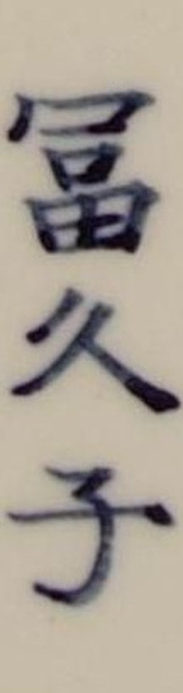冨久子
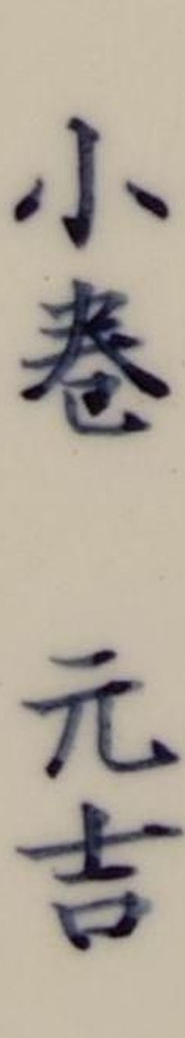小巻元吉
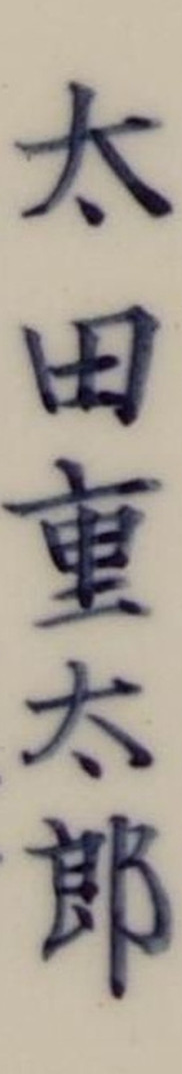太田重太郎
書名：M~S
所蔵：高野山金剛峯寺
